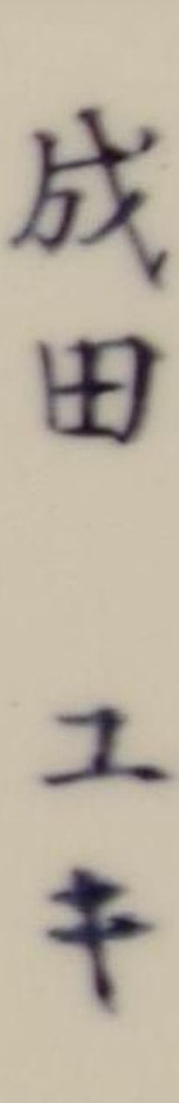成田ユキ
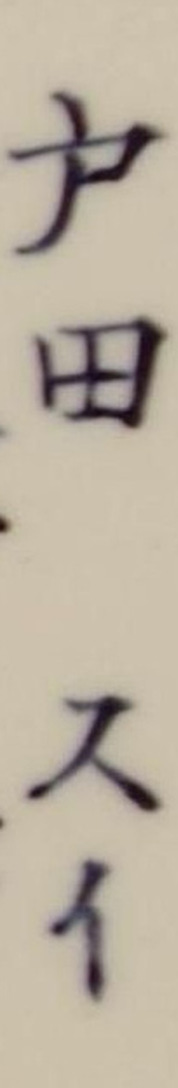戸田スイ
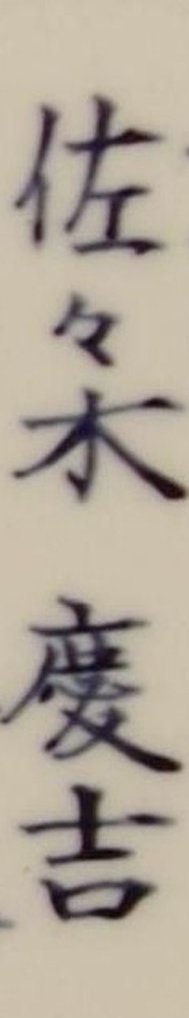佐々木慶吉
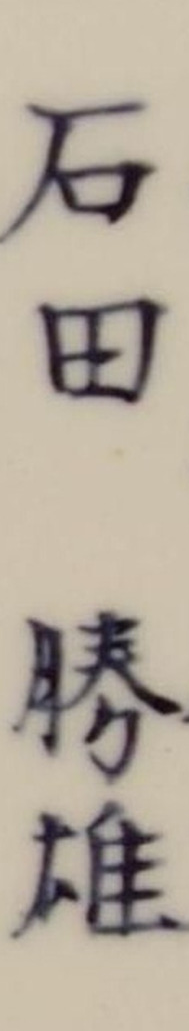石田勝雄
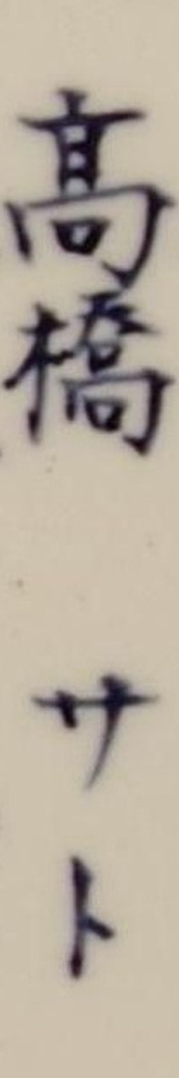高橋サト
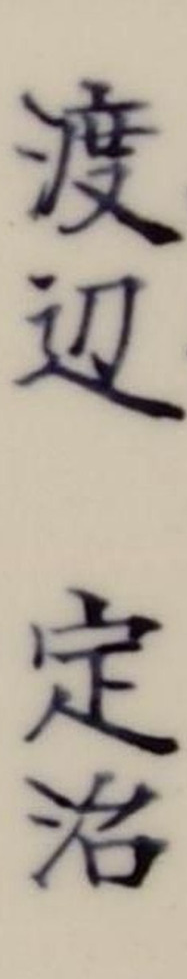渡辺定治
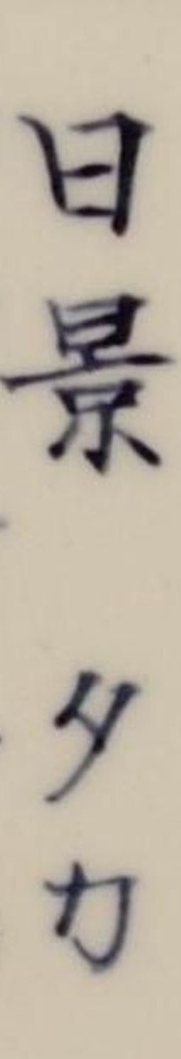日景夕カ
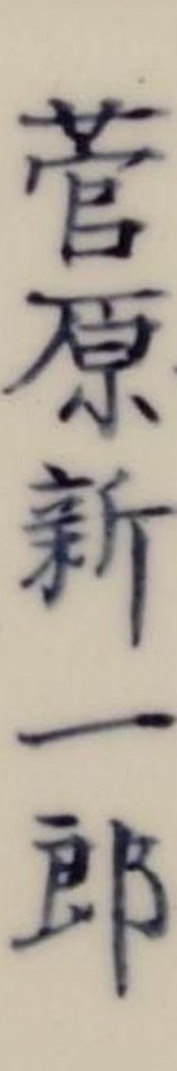菅原新一郎
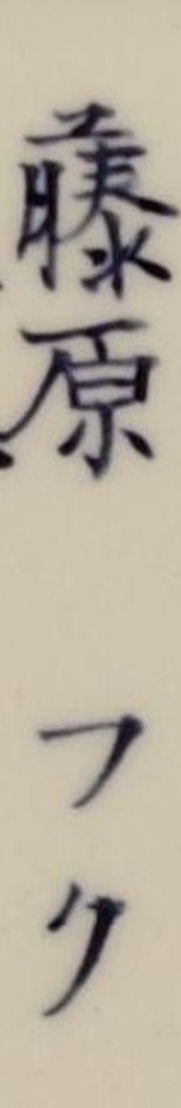藤原フク
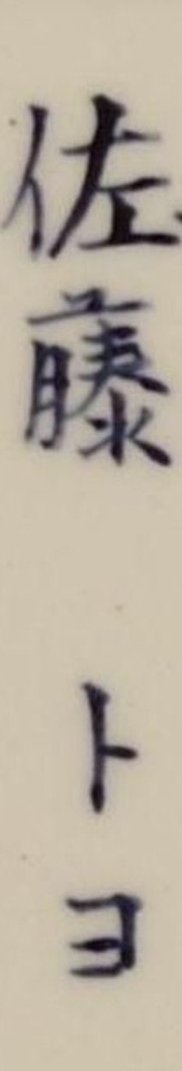佐藤トヨ
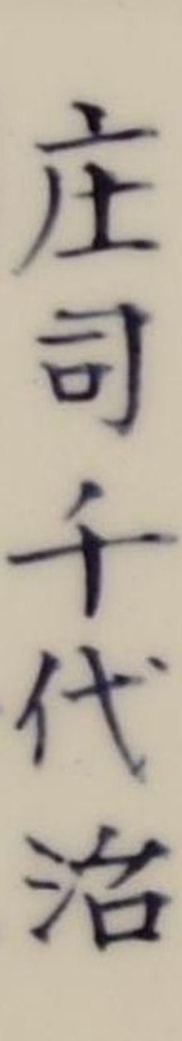庄司千代治
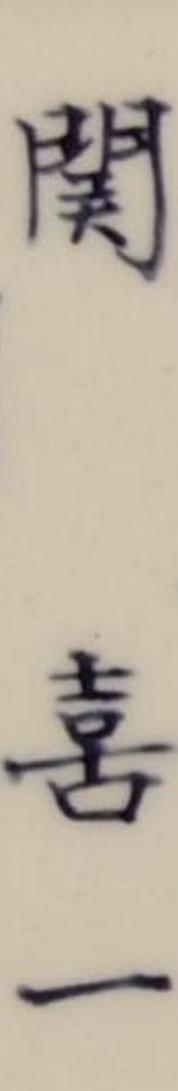関喜一
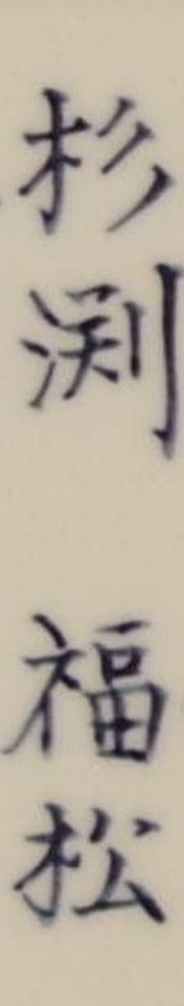杉渕福松
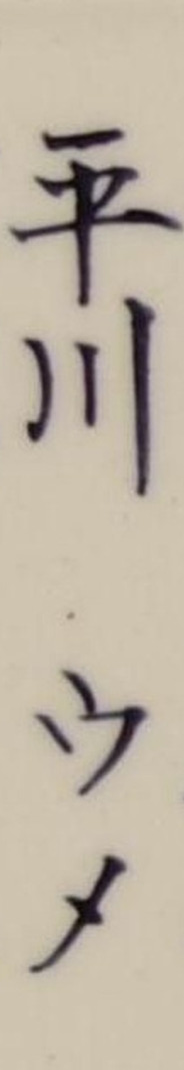平川ウメ
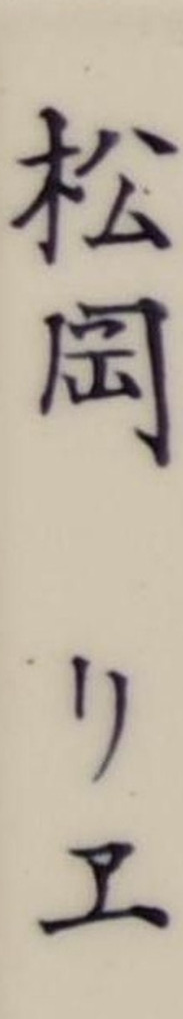松岡リエ

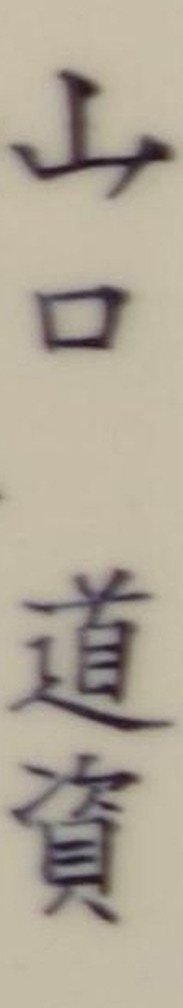山口道資
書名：E~L
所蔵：高野山金剛峯寺
